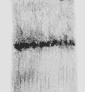一
